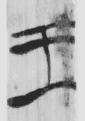王
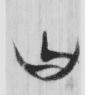曰
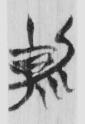劼
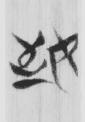姪
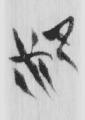{必卩}
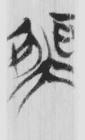{聑大}
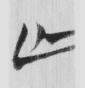亡
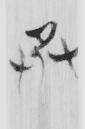{卩廾}
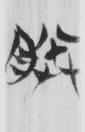朕
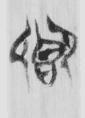鄉
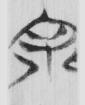余
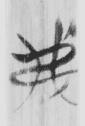弗
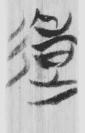造
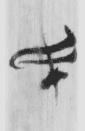民
